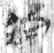於
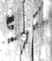子
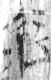盍（蓋）
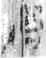於
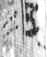丑
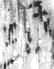城（成）
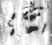於
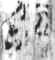寅
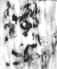○（復）
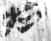於
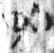卯
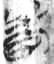○（怨）
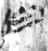於
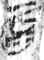晨
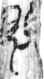○（媚）
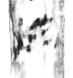於
